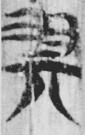○（旗）
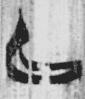㠯（以）
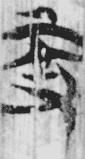○（辨）
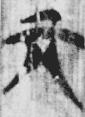亓（其）
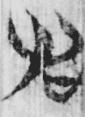左
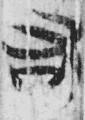右
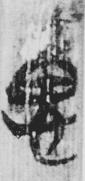思
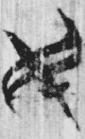民
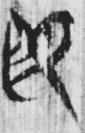母（毋）
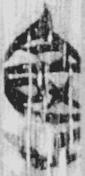○（惑）
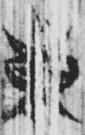東
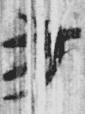方
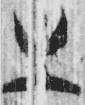之
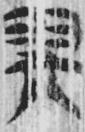○（旗）
